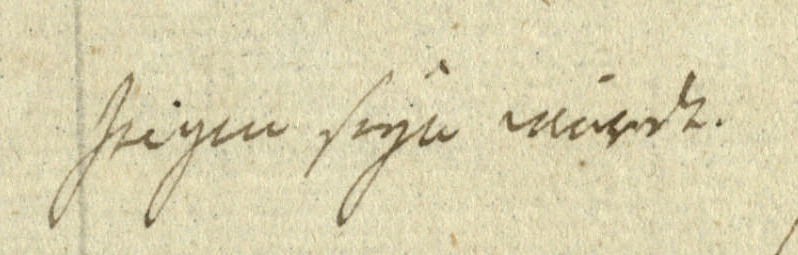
zeigen seÿn würde.
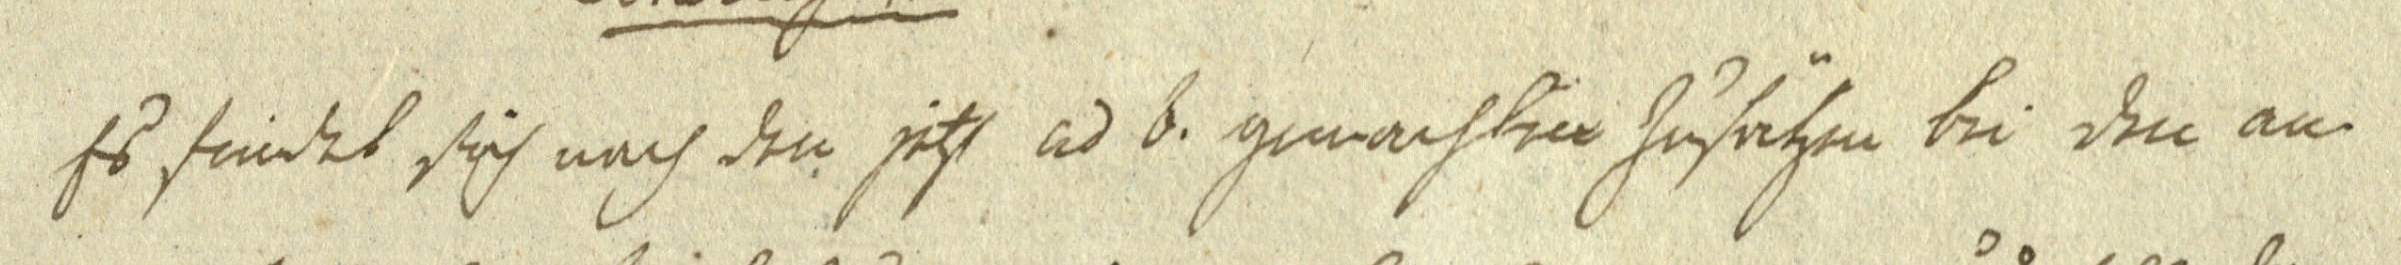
Es findet sich nach den jetzt ad b. gemachten Zusätzen bei den an¬
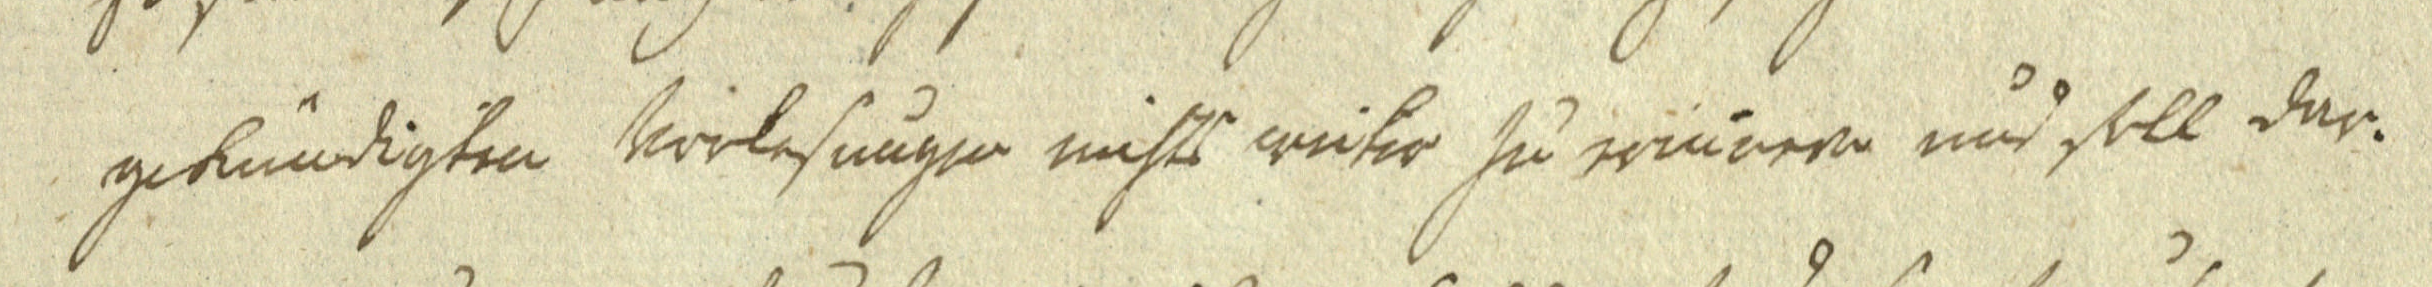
gekündigten Vorlesungen nichts weiter zu erinnern und soll dar¬
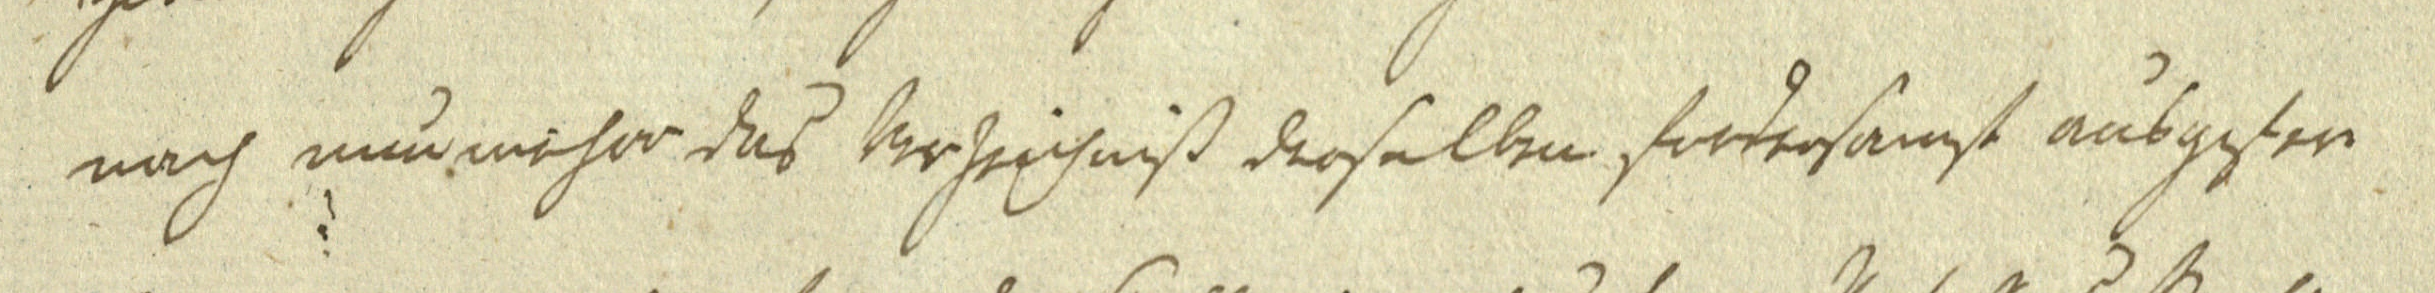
nach nunmehro das Verzeichniß derselben fordersamst ausgefer¬
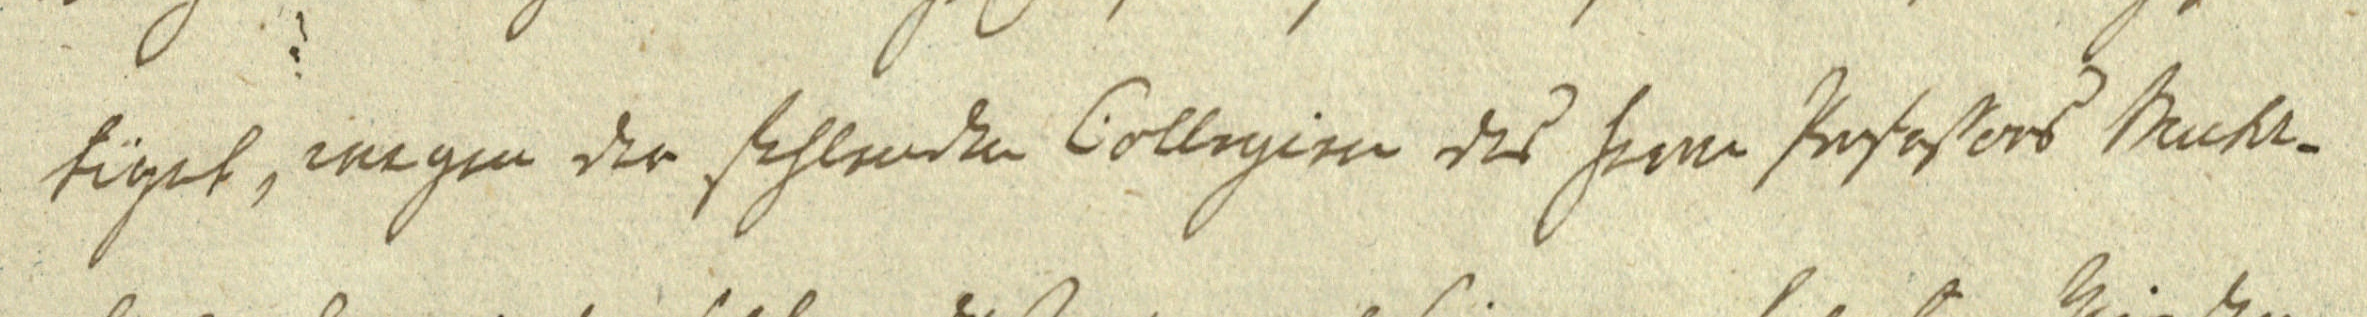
tiget, wegen der fehlenden Collegien des Herrn Professors Muhr¬
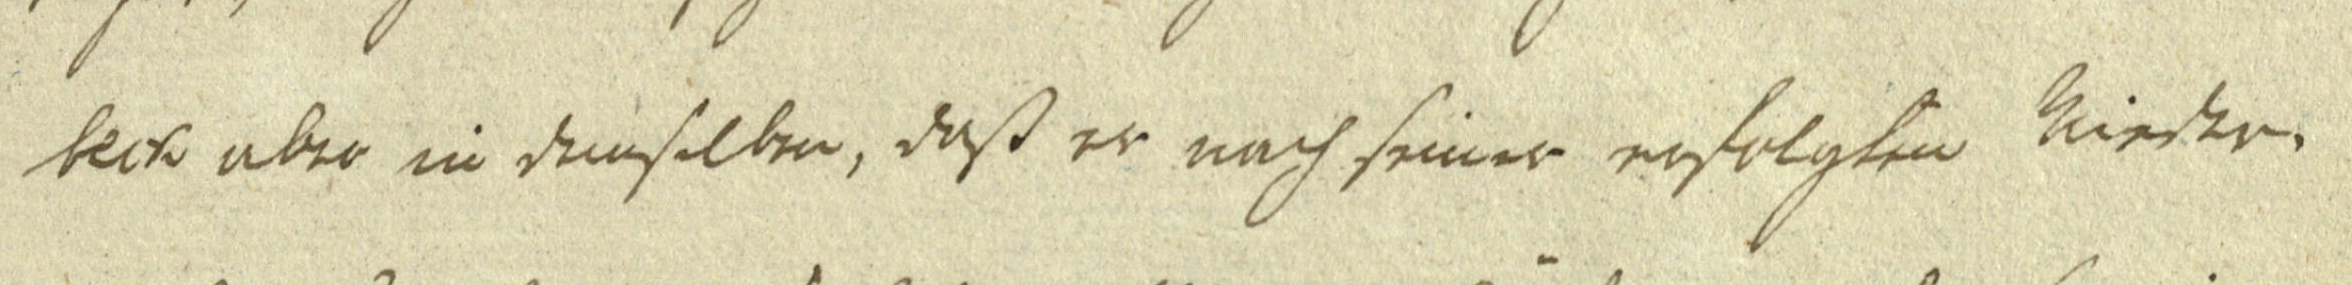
beck aber in demselben, daß er nach seiner erfolgten Wieder¬
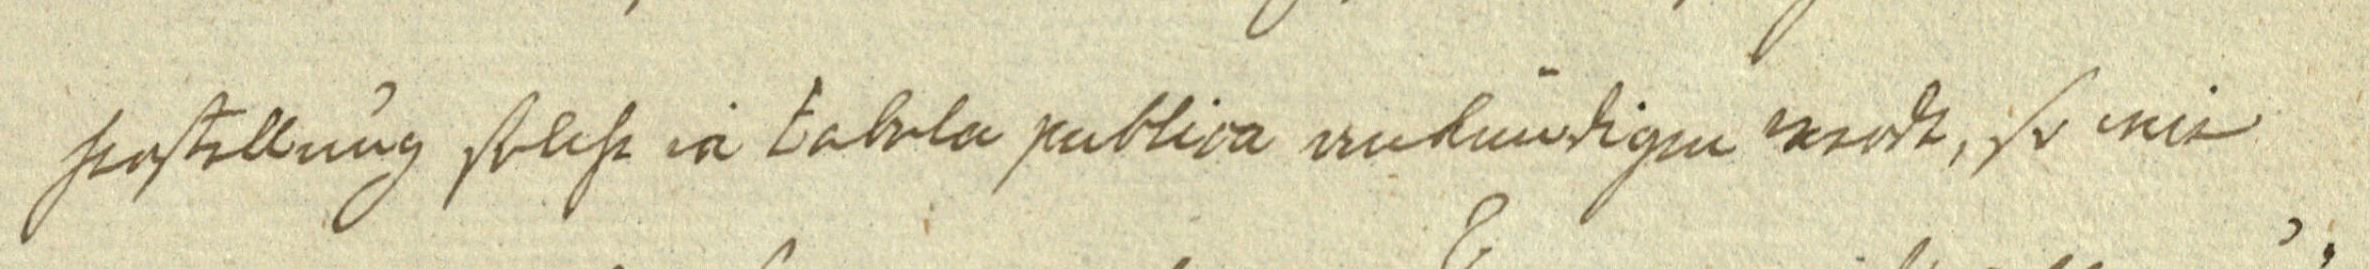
herstellung solche in tabula publica ankündigen werde, so wie
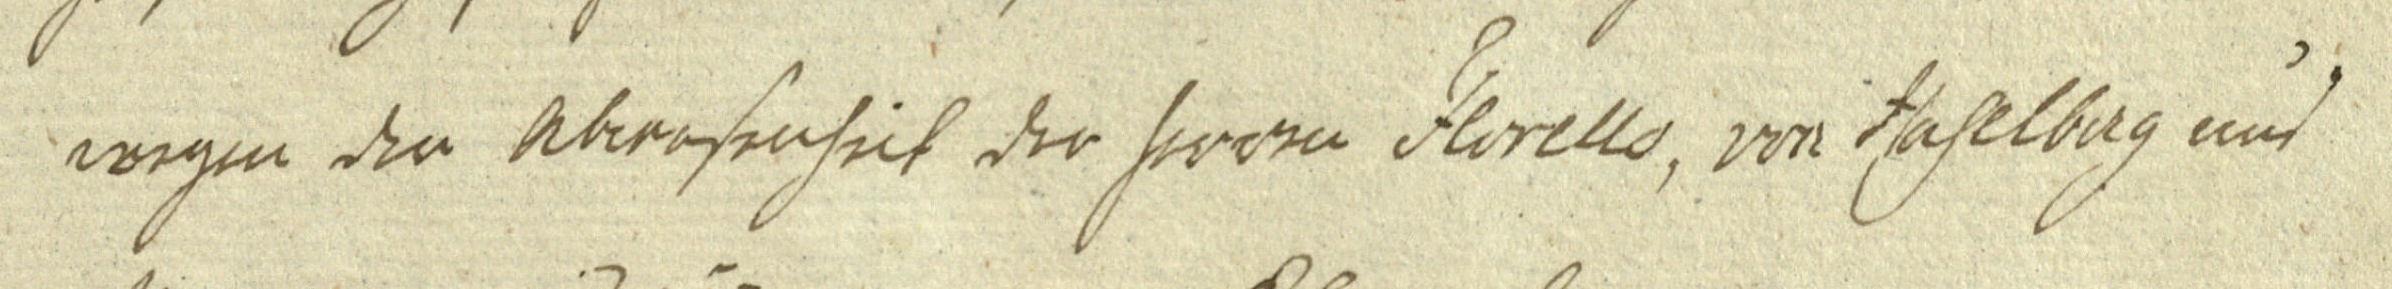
wegen der Abwesenheit der Herren Florello, von Haselberg und
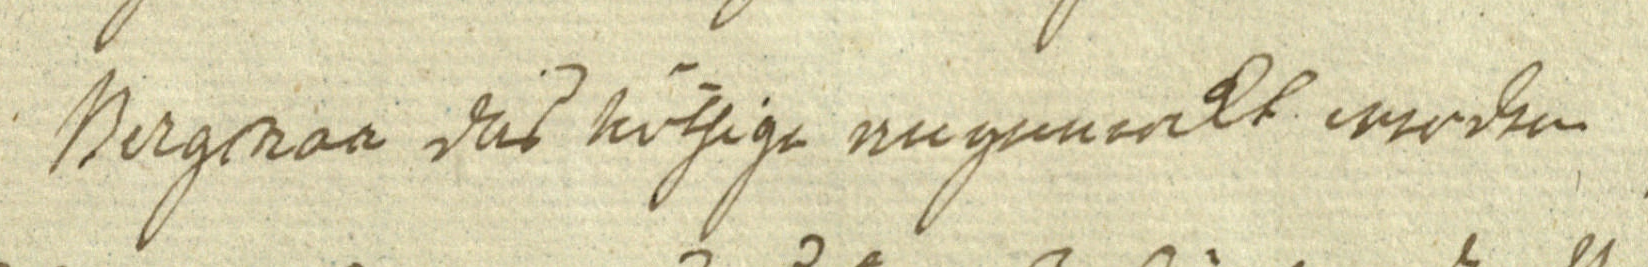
Bergman das nöthige angemerckt werden.
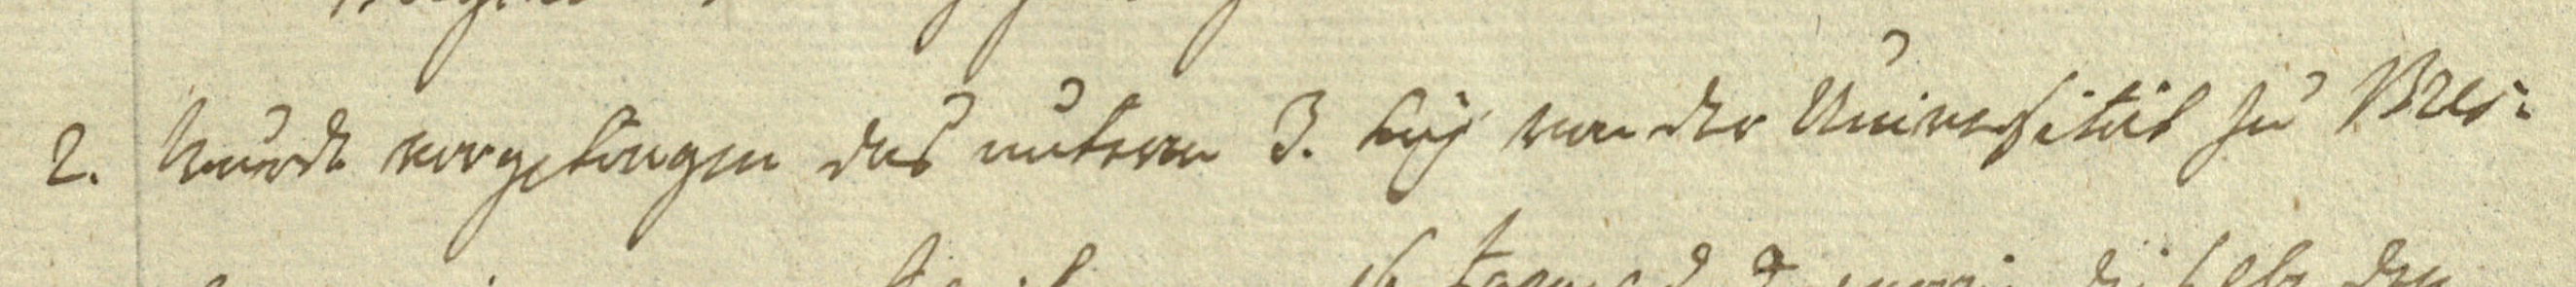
2. Wurde vorgetragen das unterm 3. huj von der Universität zu Bres¬
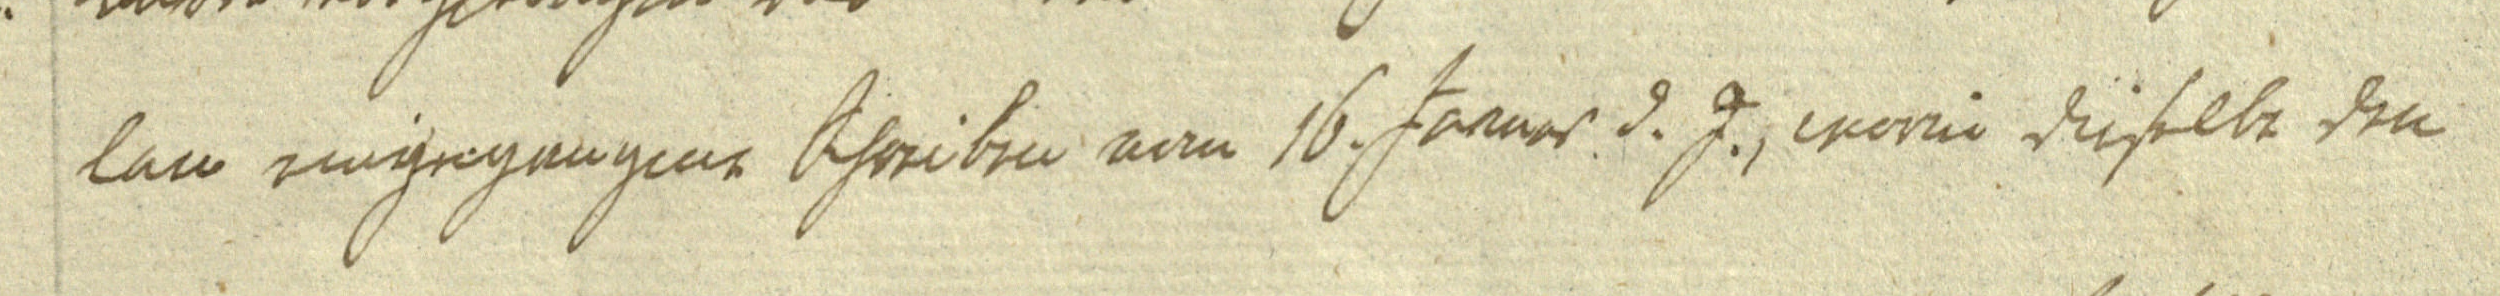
lau eingegangene Schreiben vom 16. Januar d. J., worin dieselbe den
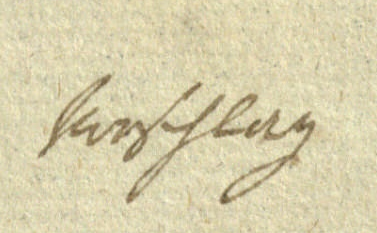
Vorschlag
